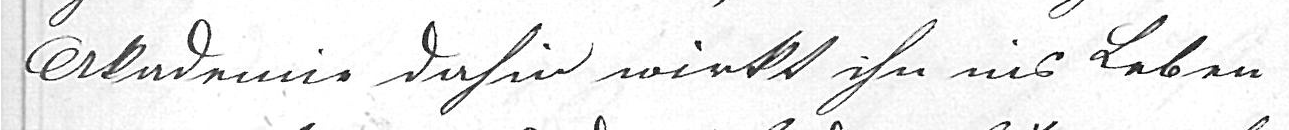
Akademie dahin wirkt, ihn ins Leben
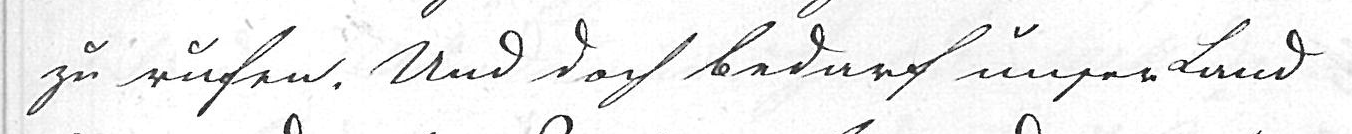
zu rufen Und doch bedarf unser Land
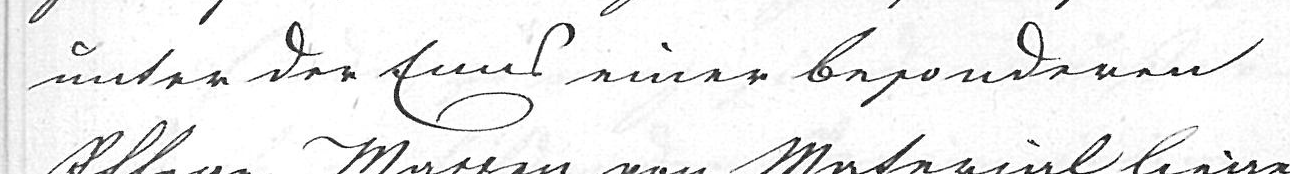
unter der Enns einer besonderen
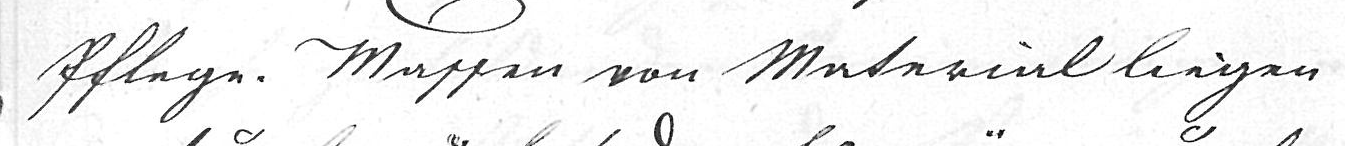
Pflege. Massen von Material liegen
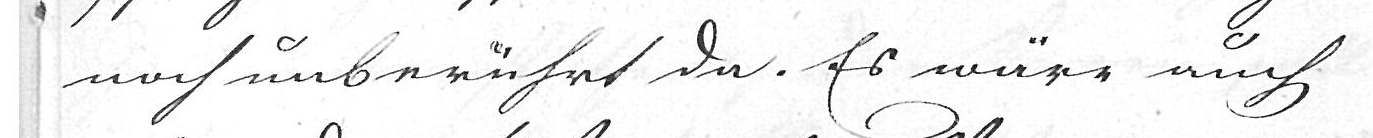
noch unberührt da. Es wäre auch
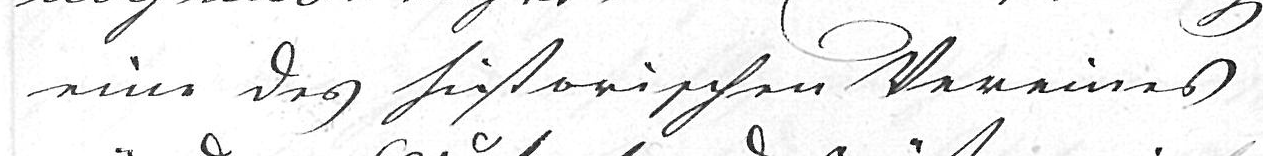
eine des historischen Vereines
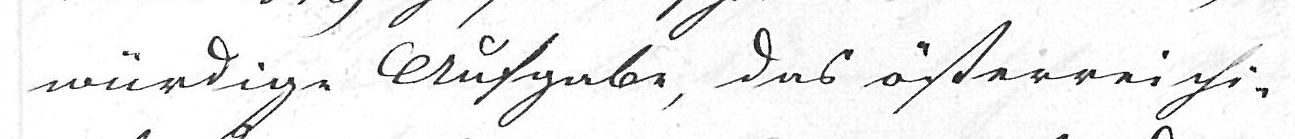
würdige Aufgaben das österreichi-
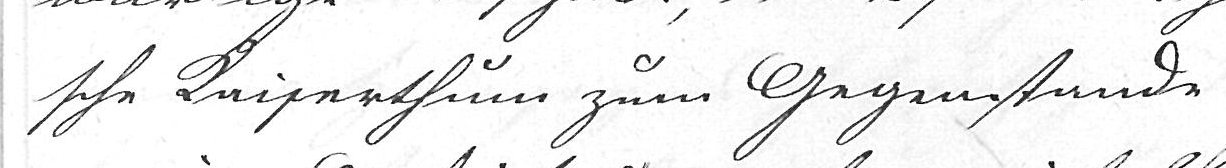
che Kaiserthum zum Gegenstande
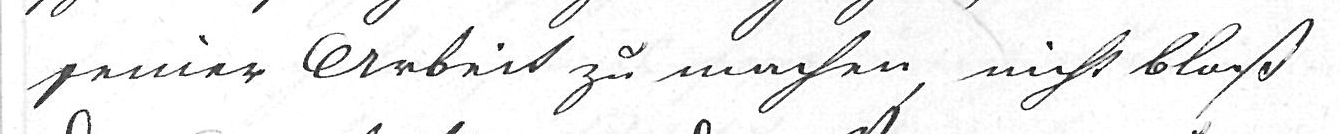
seiner Arbeit zu machen, nicht bloß
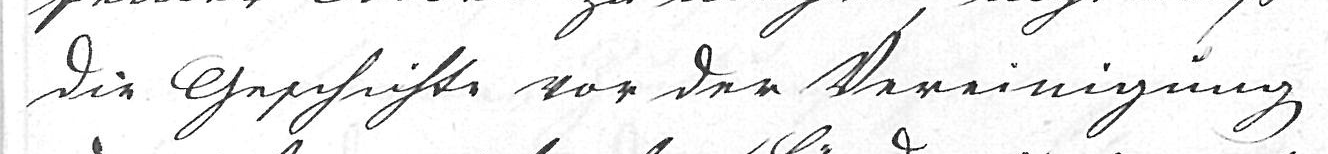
die Geschichte vor der Vereinigung
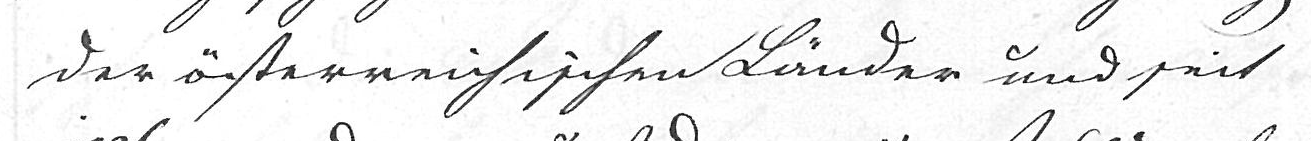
der österreichischen Länder und seit
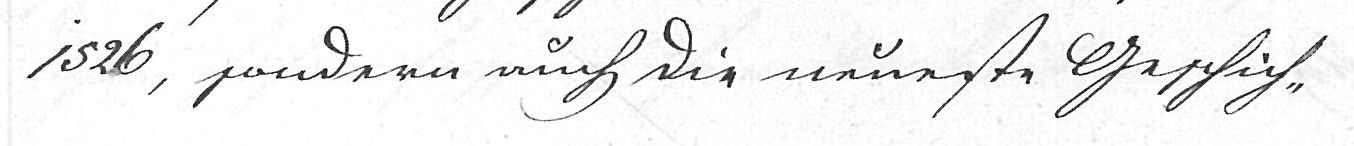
1526, sondern auch die neueste Geschich-
